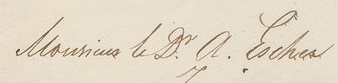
Monsieur le Dr A. Escher
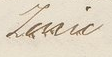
Locarno
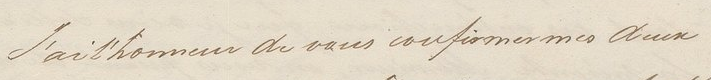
J'ai l'honneur de vous confirmer mes deux
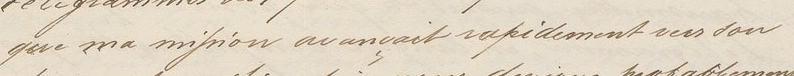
que ma mission avançait rapidement vers son
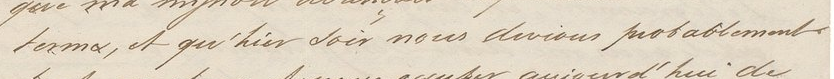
terme, et qu'hier soir nous devions probablement
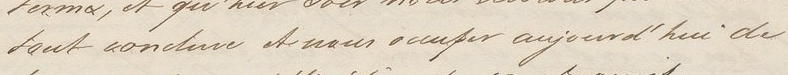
tout conclure et nous occuper aujourd'hui de
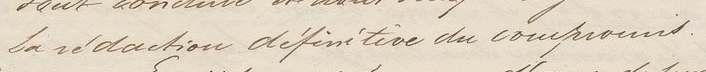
la rédaction définitive du compromis.
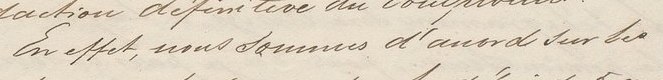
En effet, nous sommes d'accord sur les
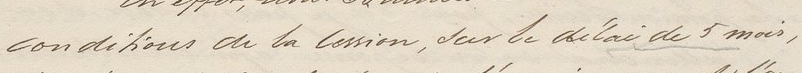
conditions de la cession, sur le délai de 5 mois,
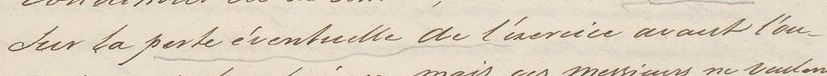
sur la perte éventuelle de l'exercice avant l'ou-
